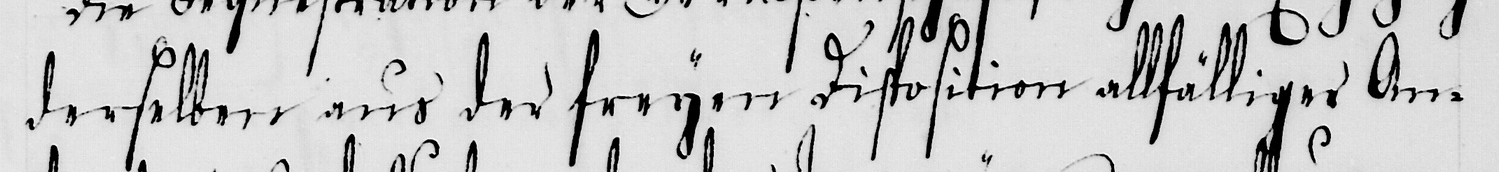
derselben aus der freyen Disposition allfälliger An¬
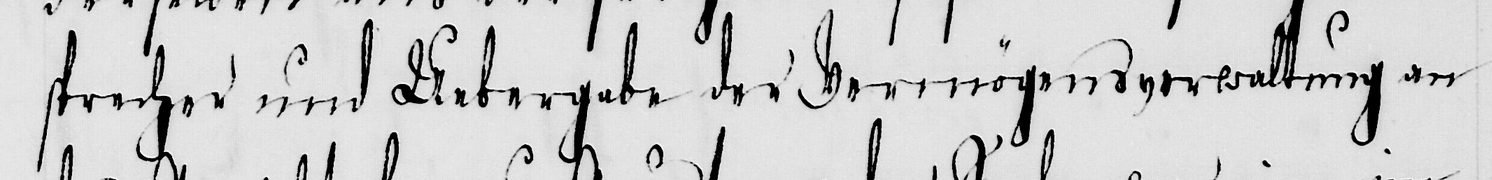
sprecher und Uebergabe der Vermögensverwaltung an
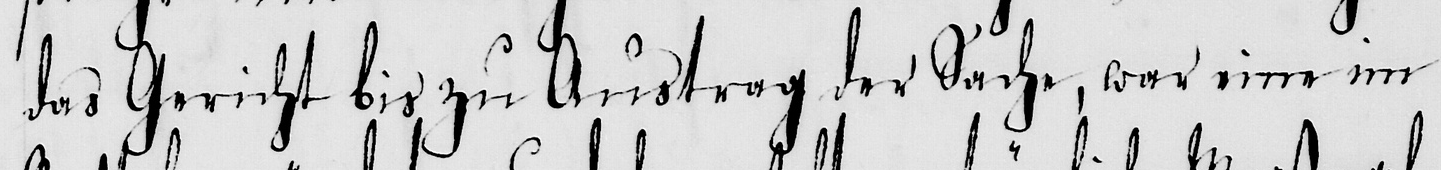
das Gericht bis zu Austrag der Sache, war eine im
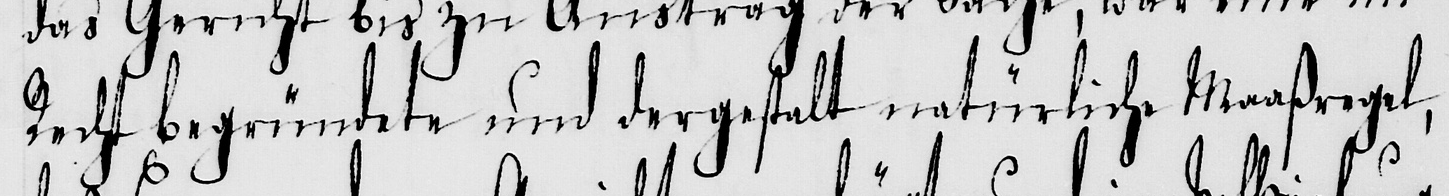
Recht begründete und dergestalt natürliche Maaßregel,
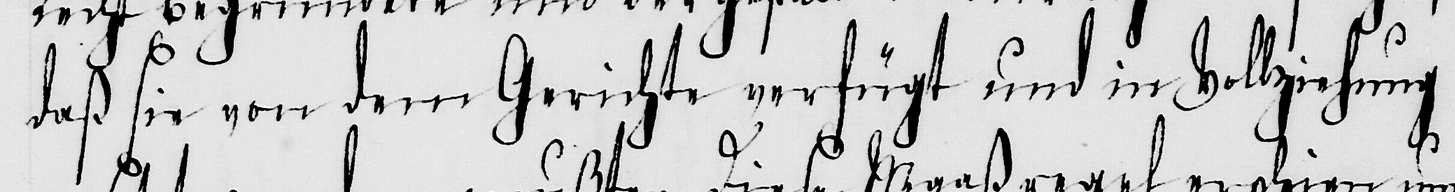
daß sie von dem Gerichte verfügt und in Vollziehung
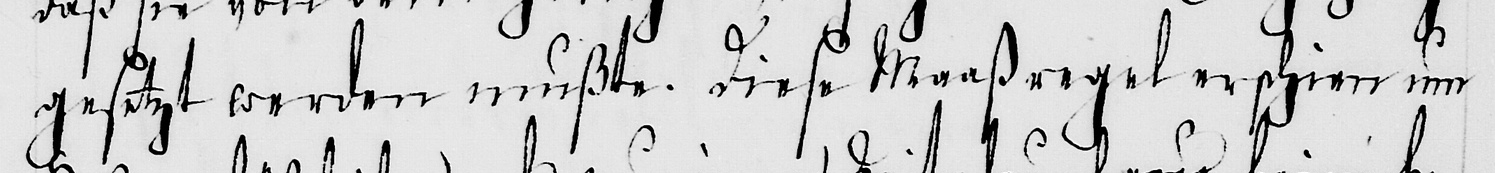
gesetzt werden mußte. Diese Maaßregel erschien um
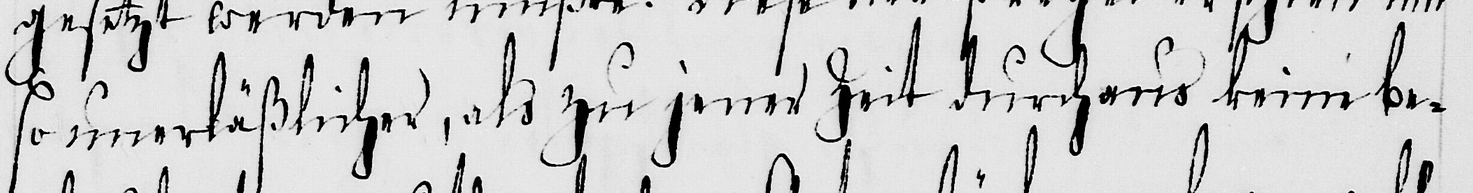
so unerläßlicher, als zu jener Zeit durchaus keine be¬
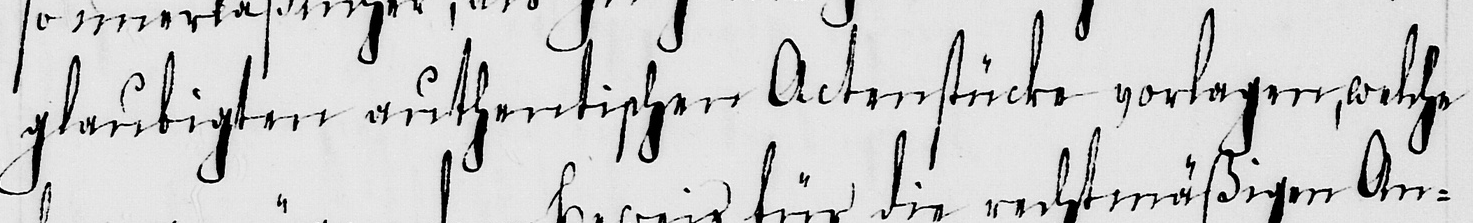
glaubigten authentischen Actenstücke vorlagen, welche
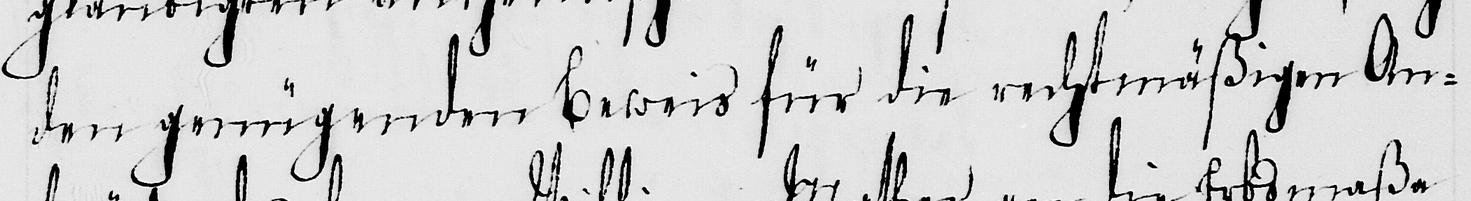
den genügenden Beweis für die rechtmäßigen An¬
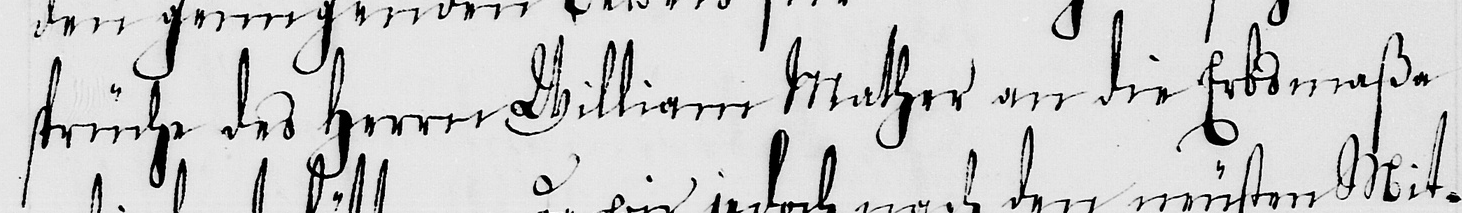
sprüche des Herrn William Mather an die Erbsmaßa
